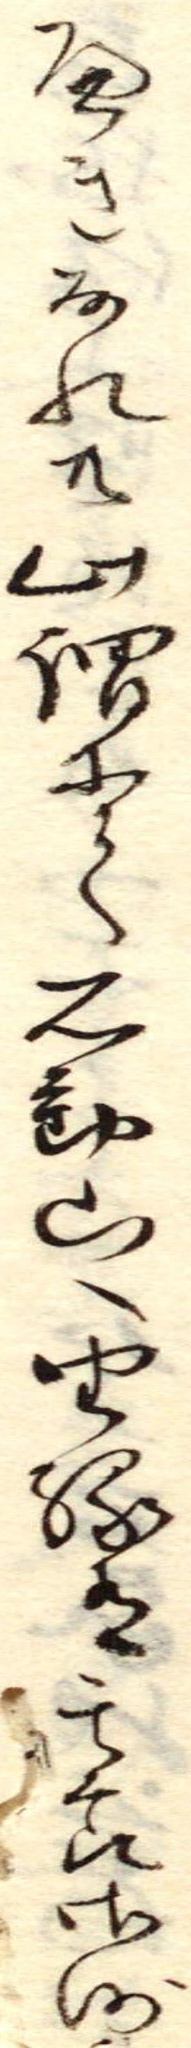へきなれ共此謂にて石動山へ由縁有其節御沙
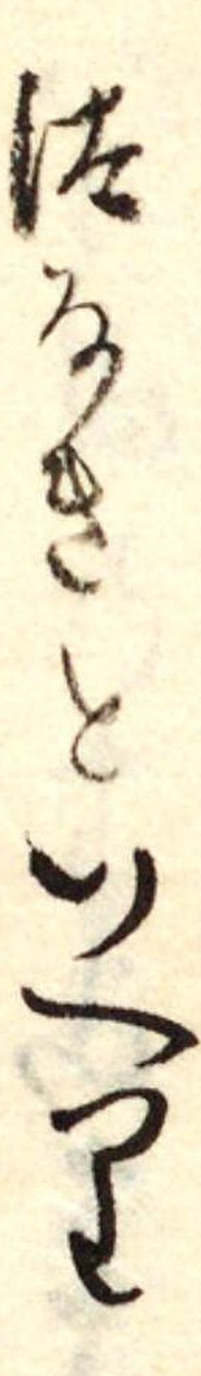汰なきといへり
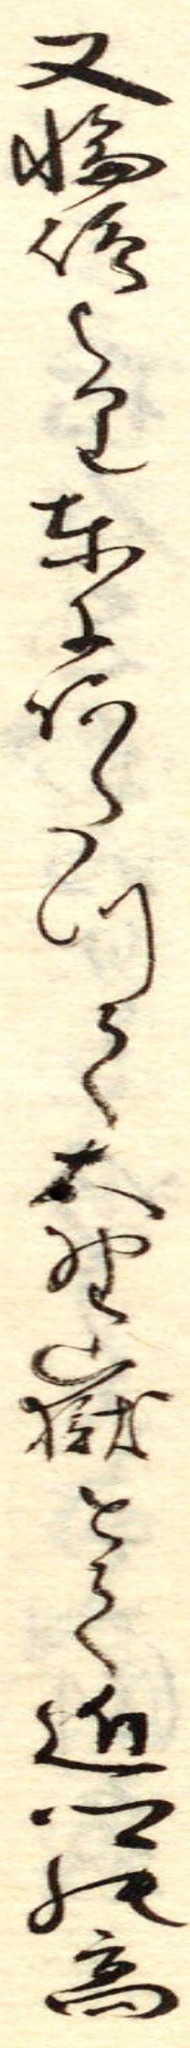又輪嶋より東にあたつて大野嶽とて近郷の高
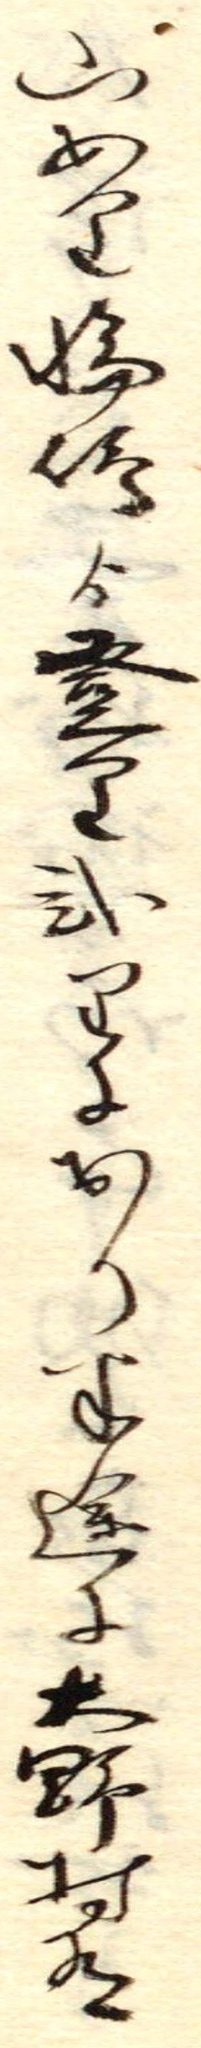山あり輪嶋ゟ登り弐里あり半途に大野村有
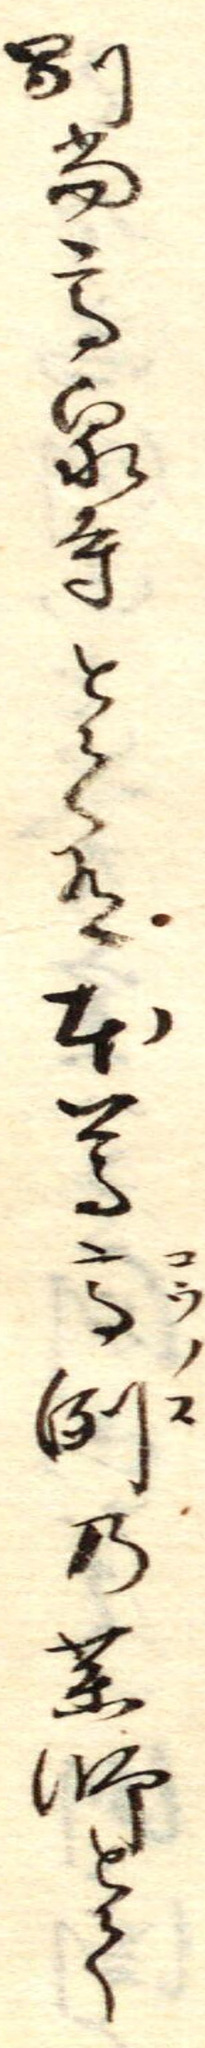別当高泉寺とて有本尊高洲の薬師とて
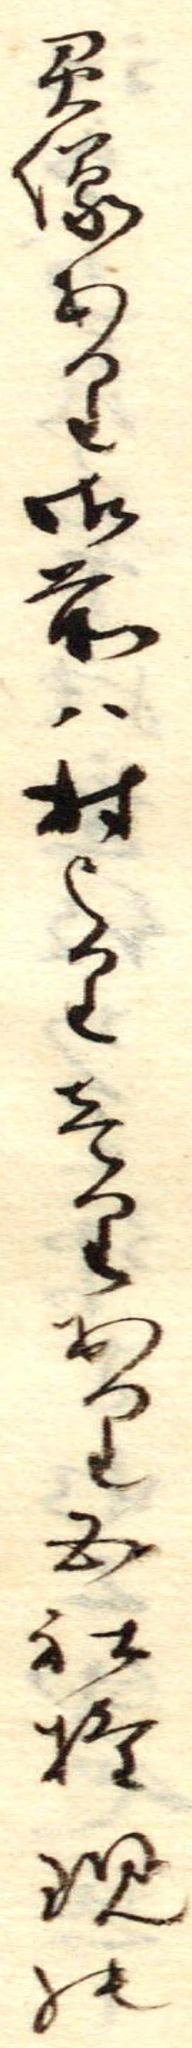霊像あり御前は村より壱里あり五社権現の

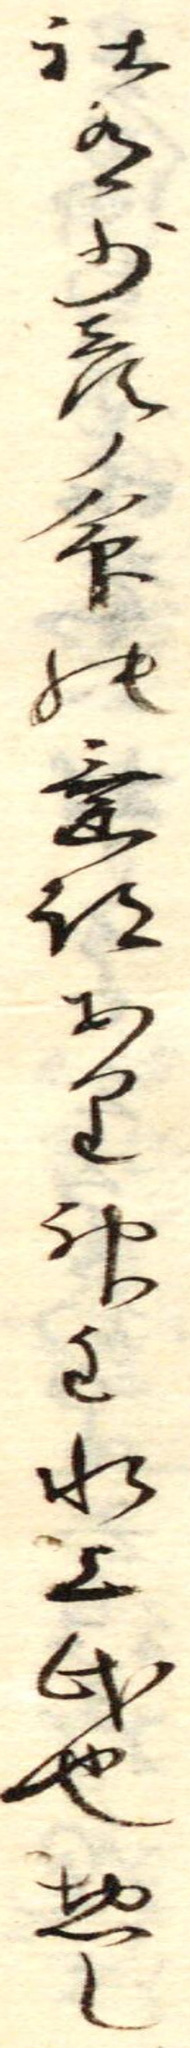社有少彦ノ命の跡あり神主水上氏也惣し
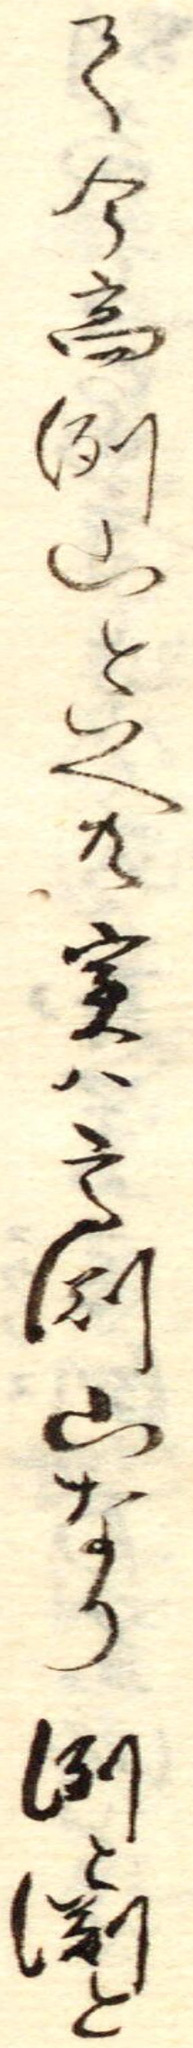て今高洲山といへ共実は高淵山なり洲と淵と
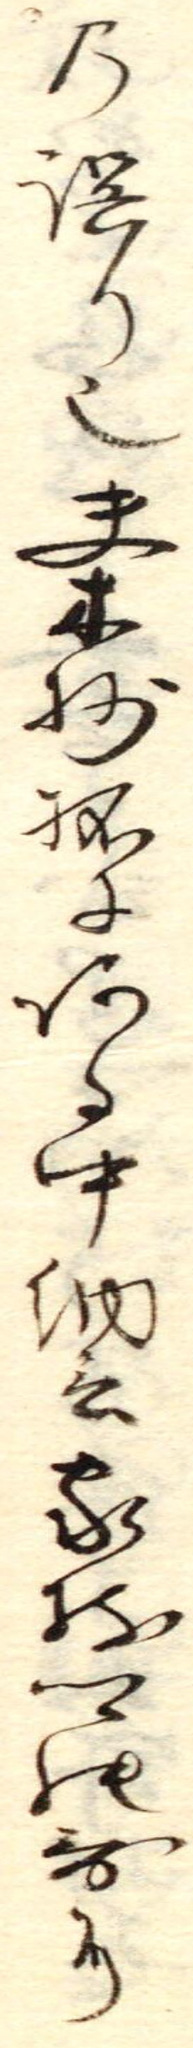の誤り也夫木抄等にある中納言家持卿の哥に
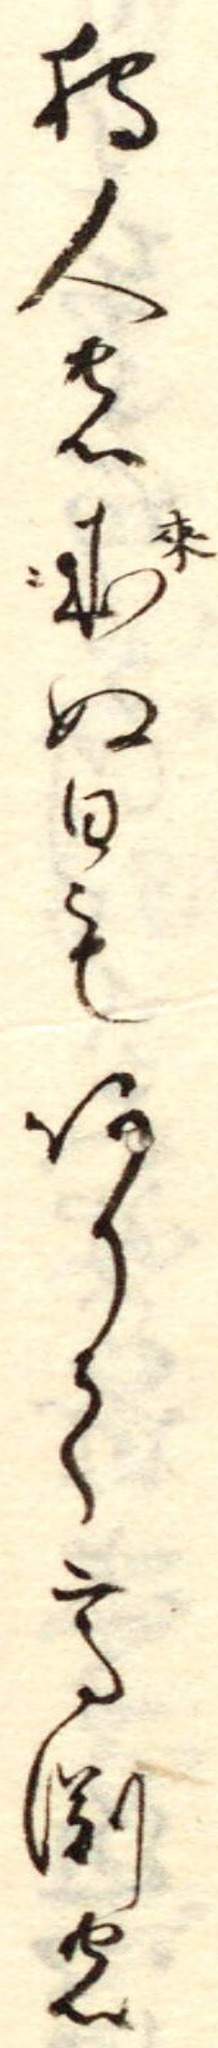狩人の来ぬ日もありて高淵の
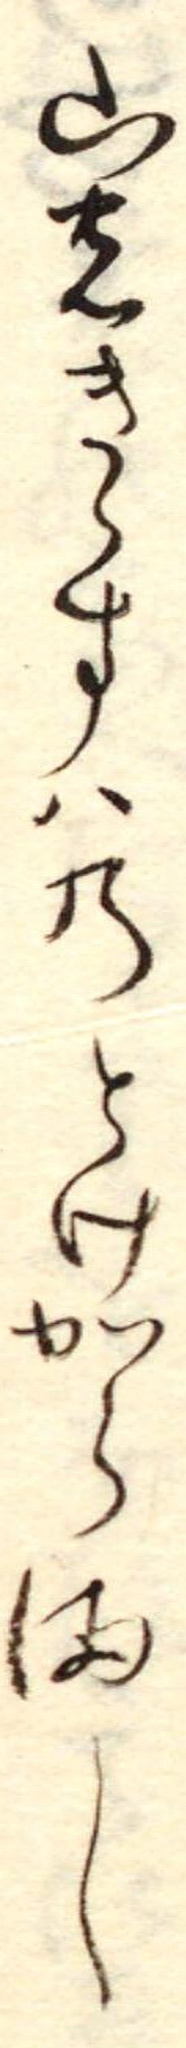山のきゝすはのとけからまし
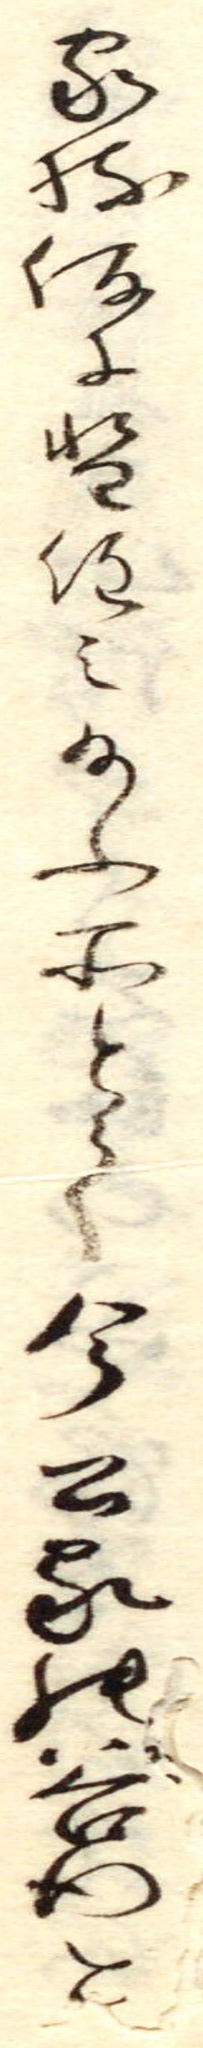家持仮に暫住み給ふ所とて今公家の谷内と
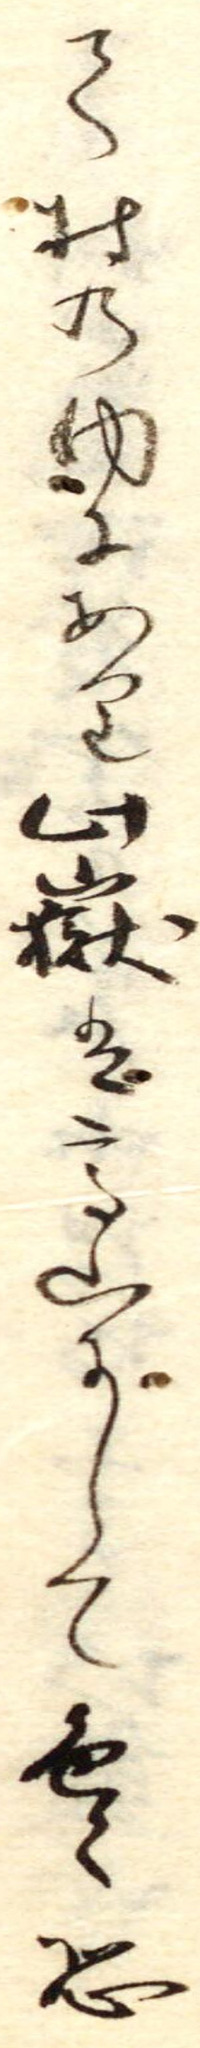て村の内にあり此嶽は高山にして色々恐
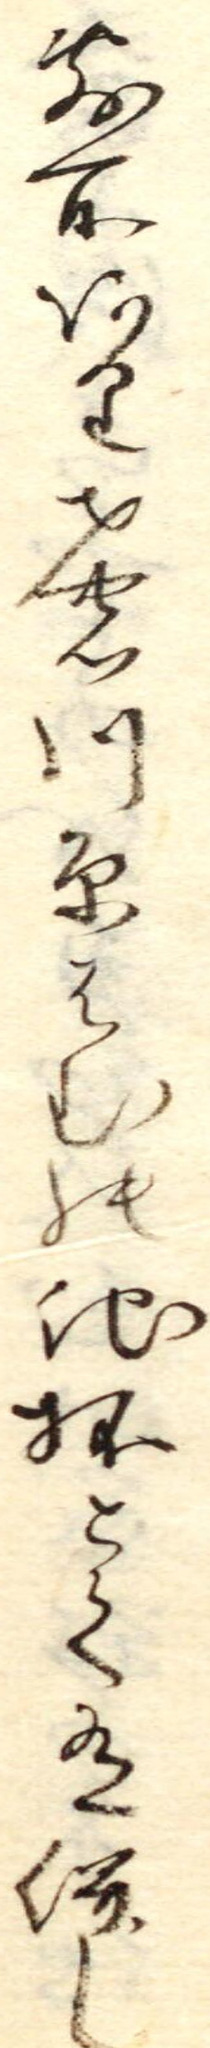敷所あり才の川原はむの池抔とて有併し
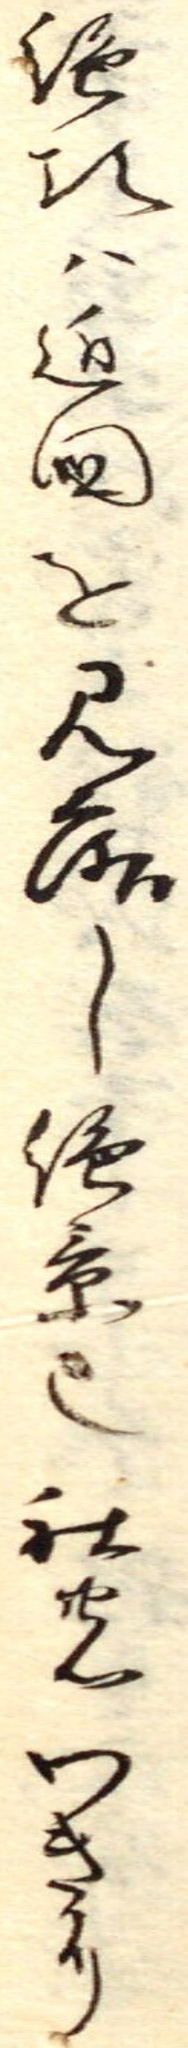絶頃は近国を見落し絶景也社のわきに
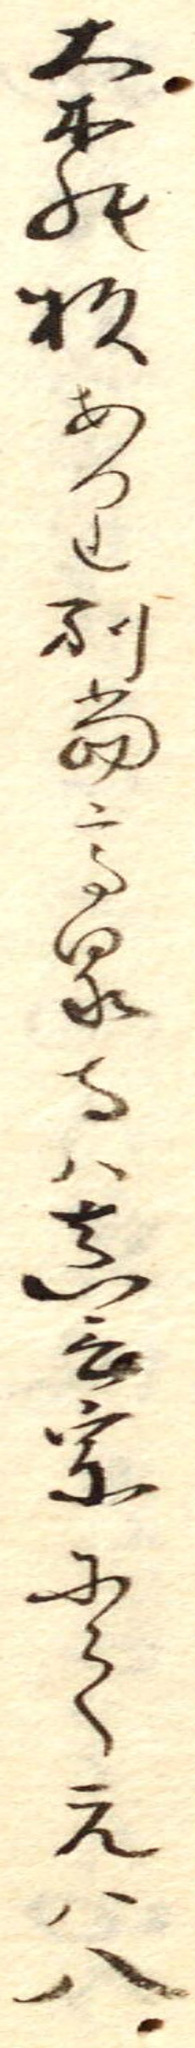大木の杉あり別当高泉寺は真言宗にて元は八
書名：能登名跡誌
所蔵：Ishikawa Prefectural Library
